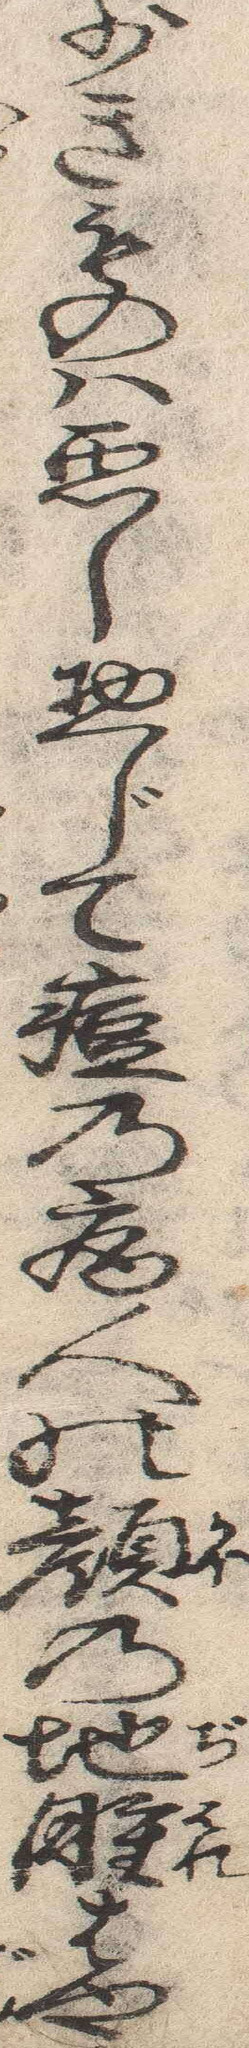少きものは悪し総じて痘の病人の顔の地腫はや
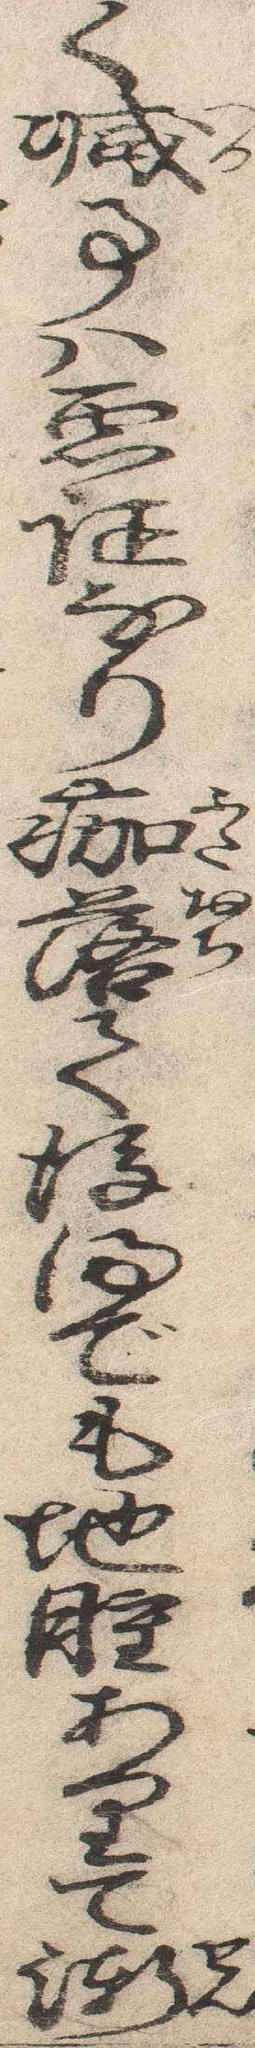く減事は悪証なり痂落て後までも地腫ありて漸
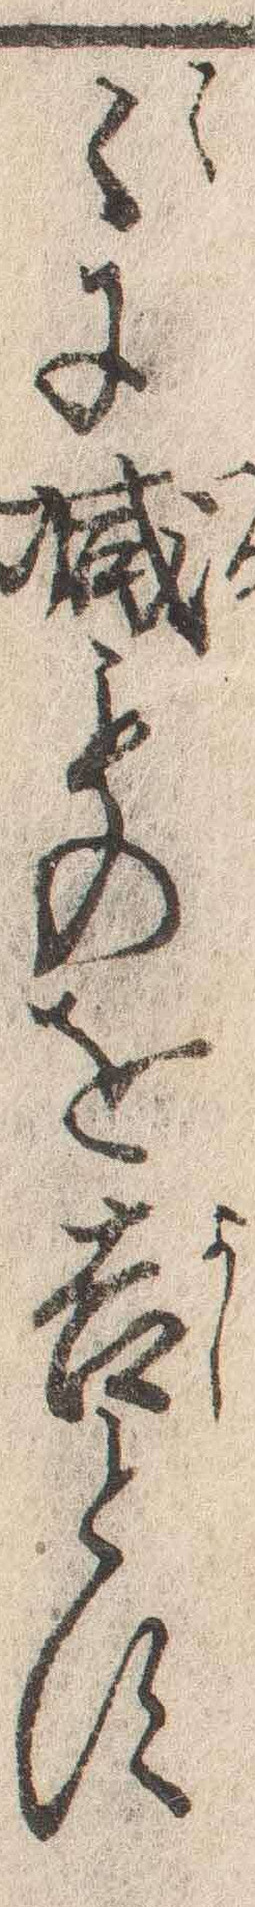々に減ものを吉とす
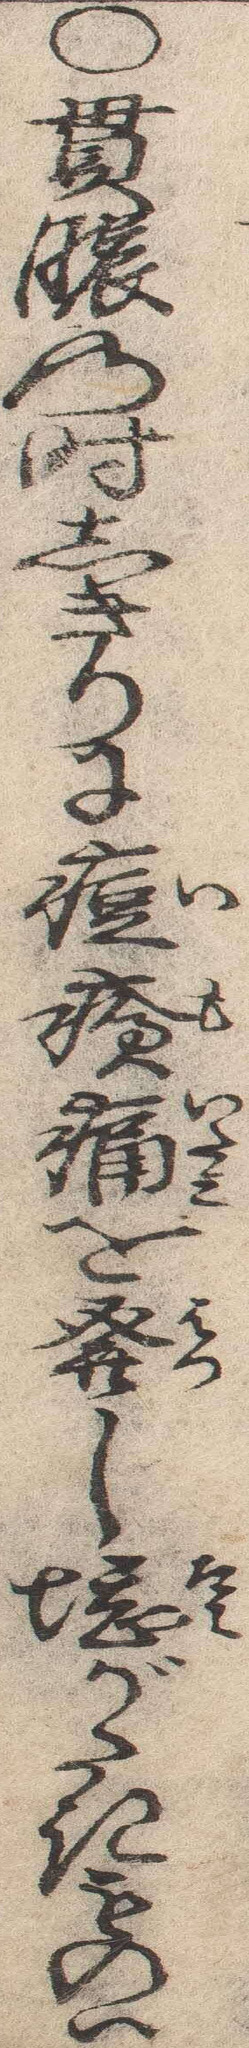○貫膿の時しきりに痘瘡痛を発し堪がたきものは

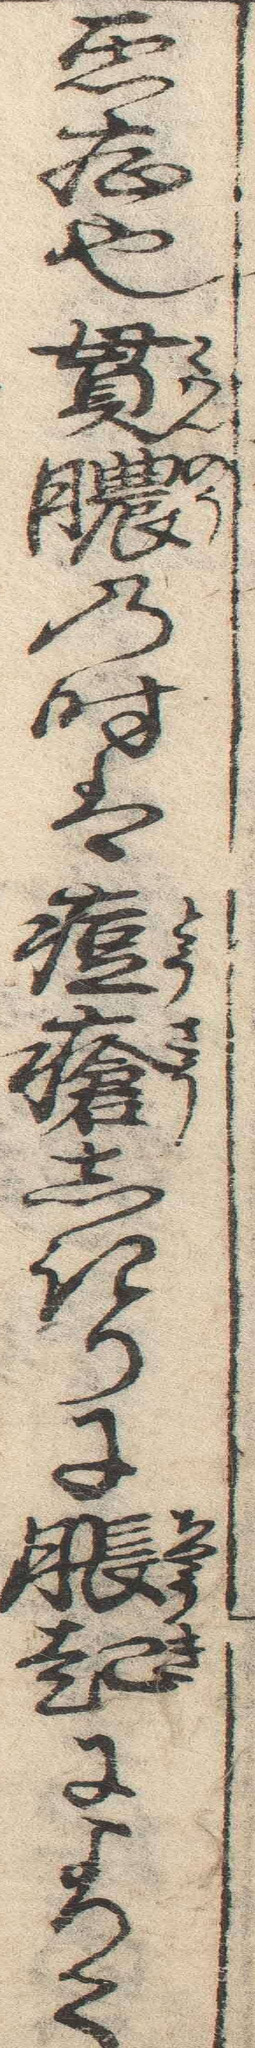悪症也貫膿の時は痘瘡しきりに脹起によりて
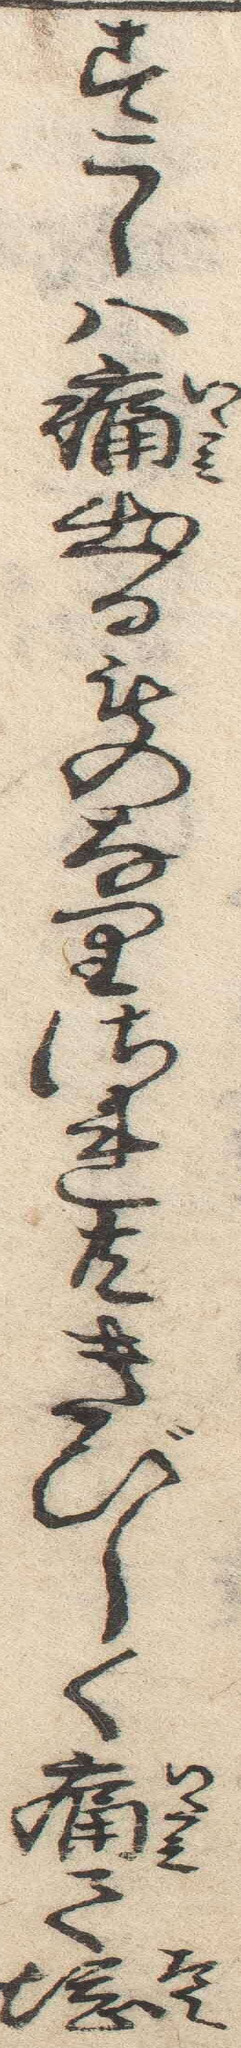すこしは痛出るものなりされ共きびしく痛て堪
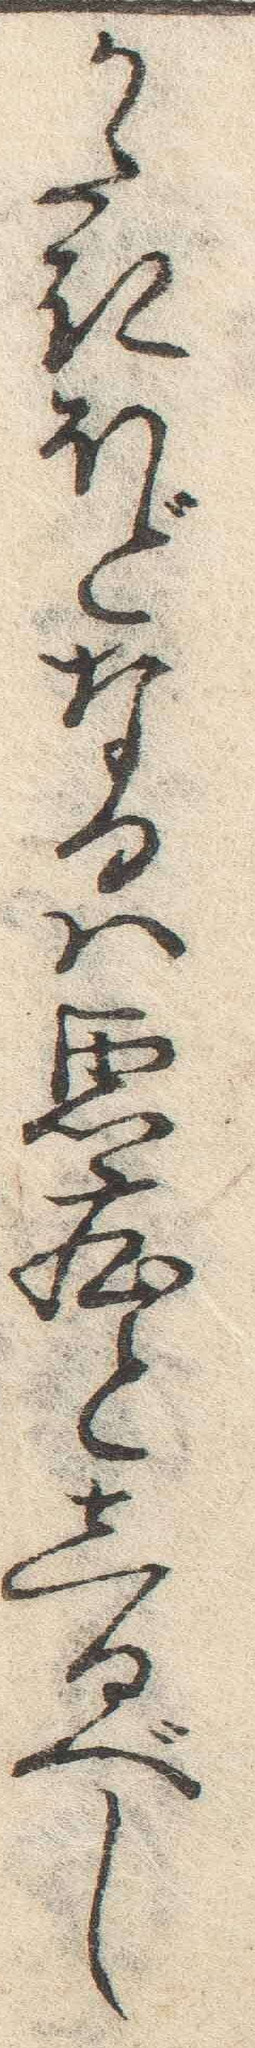かたきほどなるは悪症としるべし
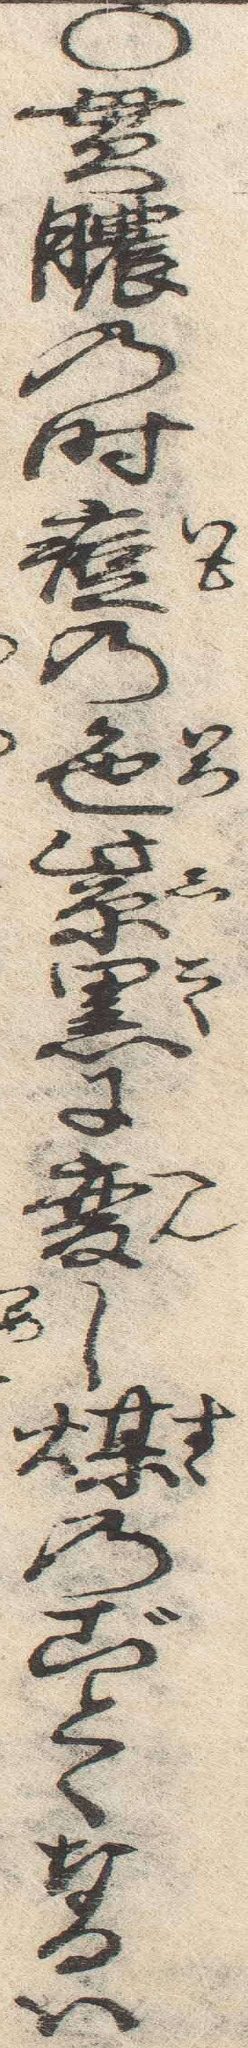○貫膿の時痘の色紫黒に変し煤のごとくなるは
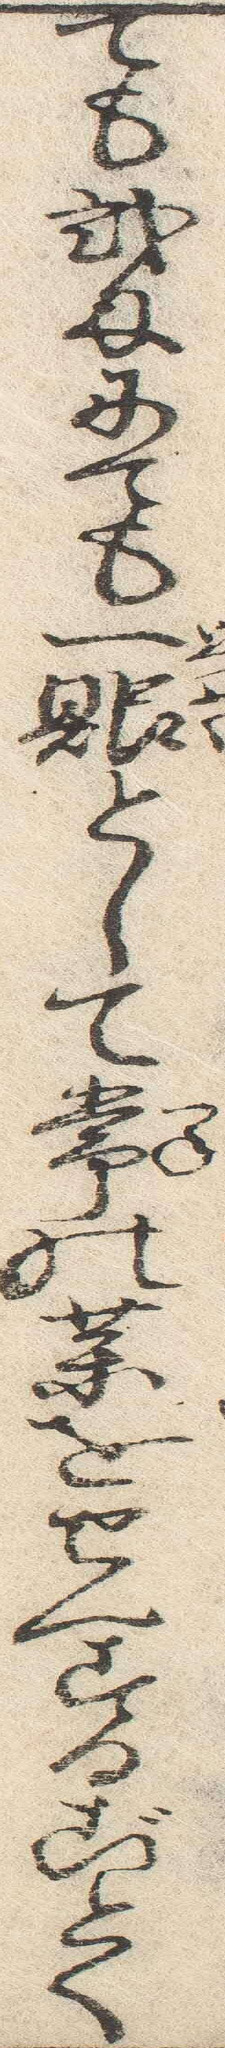ても弐匁にても一服として常の薬をせんするごとく
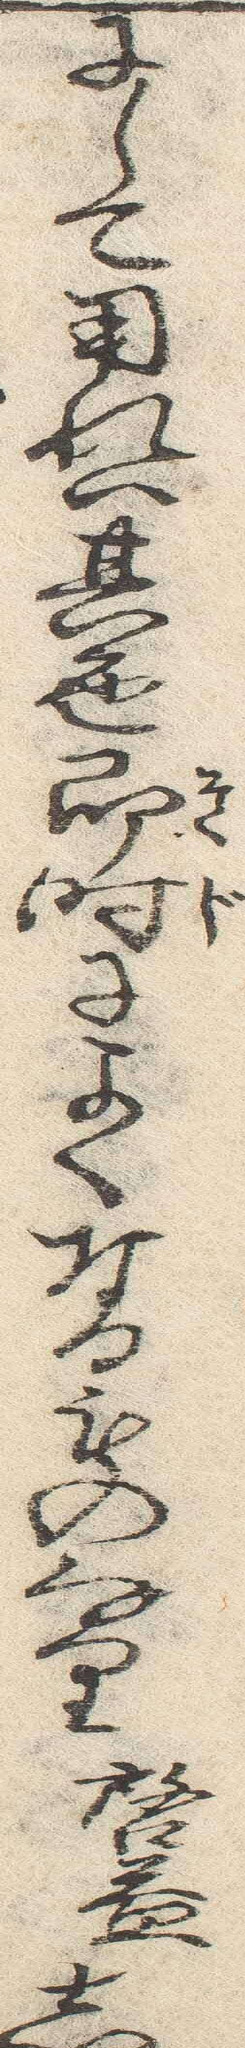にして用れは其色即時によくなるものなり啓益し
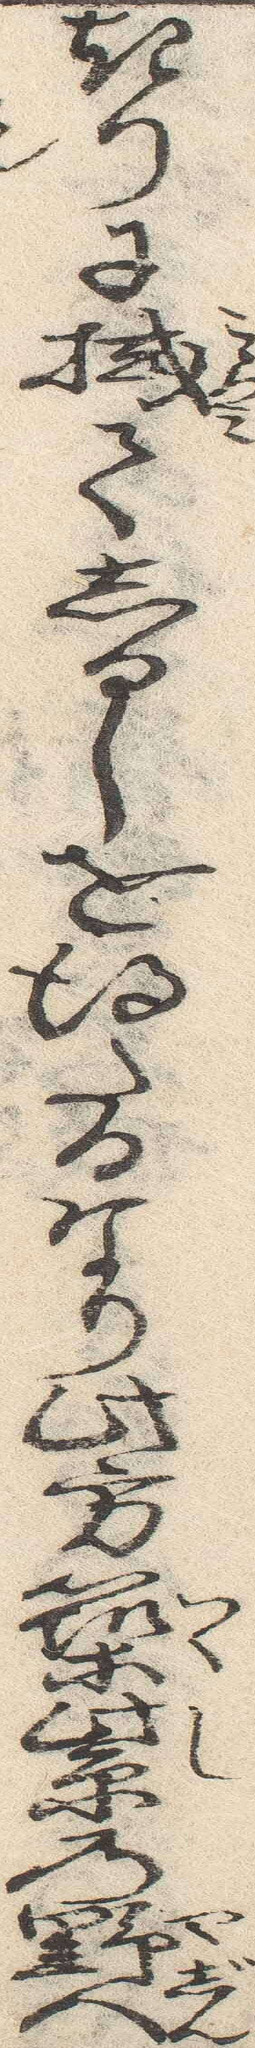きりに試てしるしを得たるなり此方築紫の野人
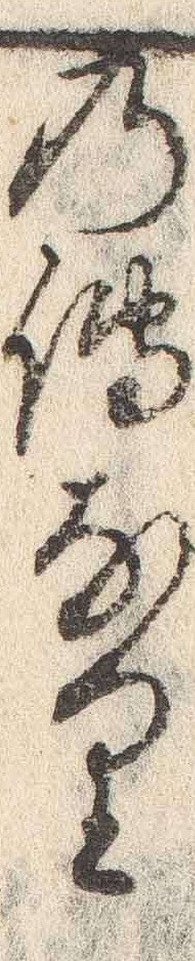の伝なり
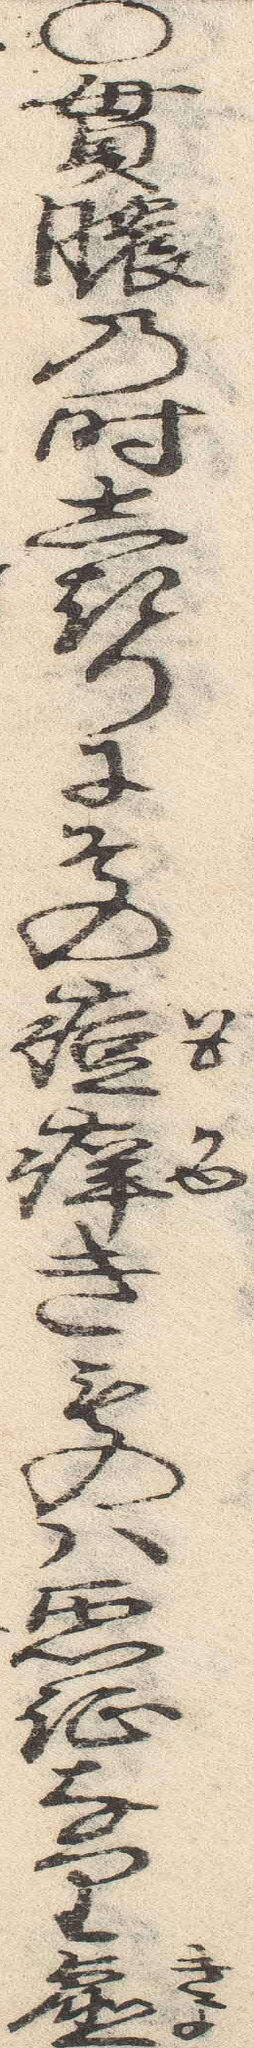○貫膿の時しきりにその痘痒きものは悪証なり虚
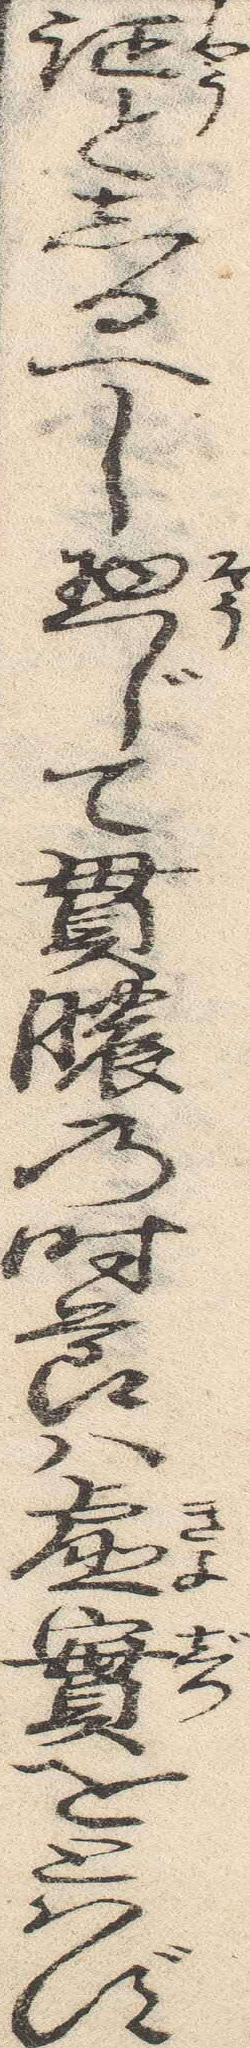証としるへし総じて貫膿の時節は虚実をとはず
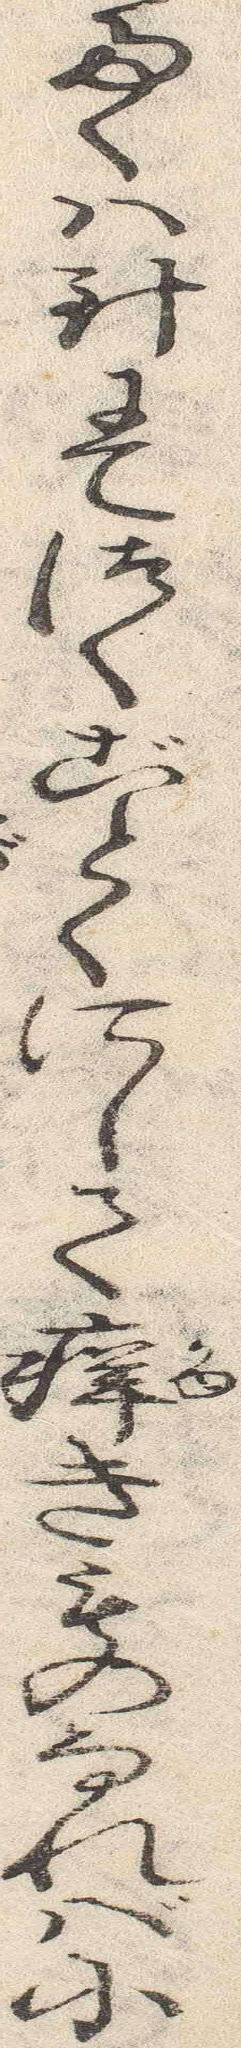多くは針にてつくごとくにして痒きものなれば小
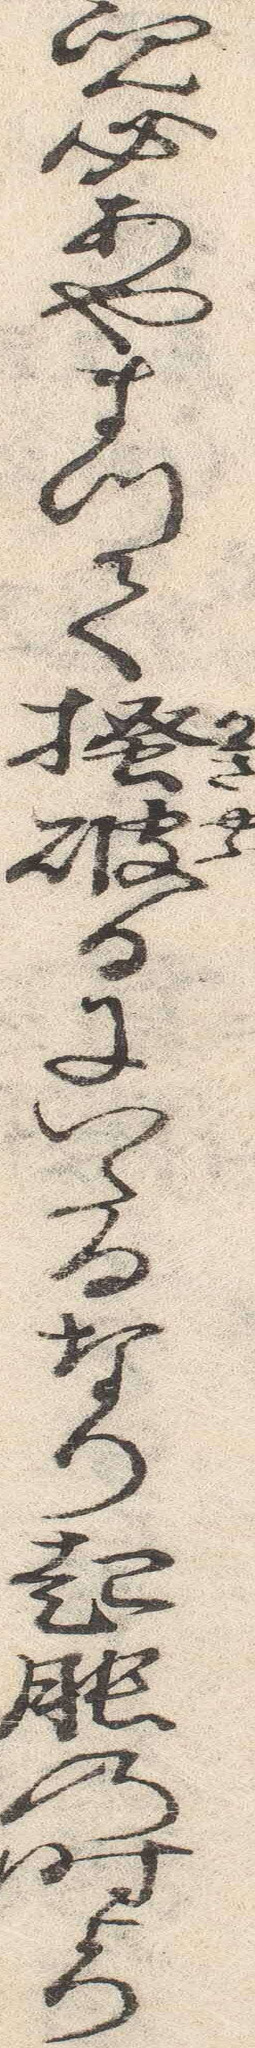児必あやまつて搔破るにいたるなり起脹の時より
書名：小児必用養育草
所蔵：東京学芸大学附属図書館 国文学研究資料館
